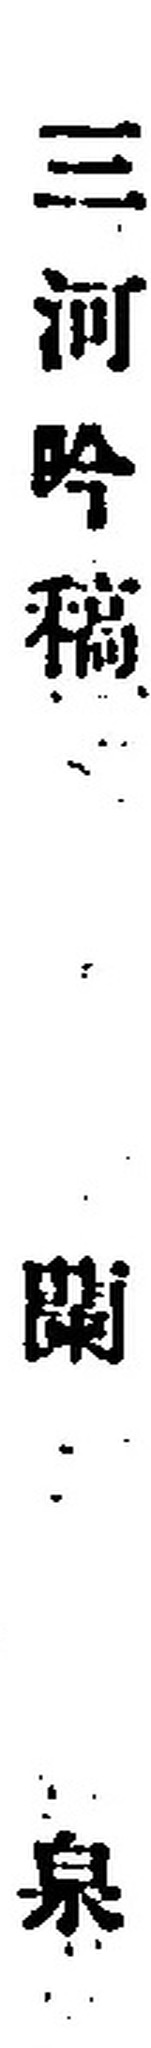三河吟稿蘭泉
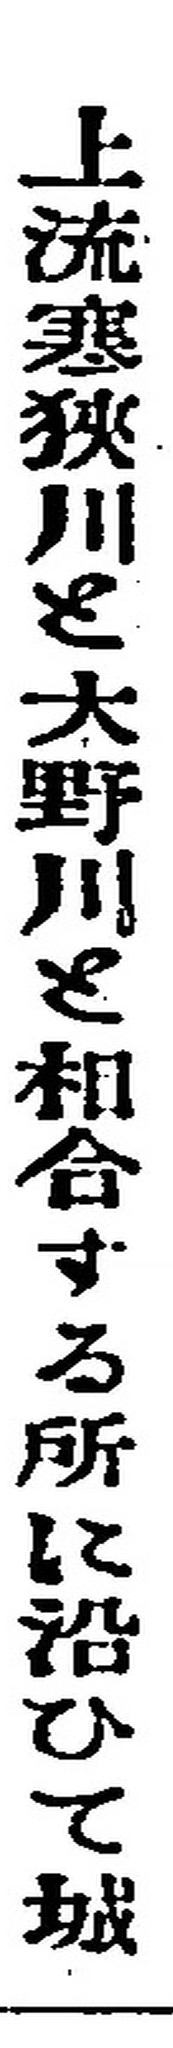上流寒狭川と大野川と相合する所に沿ひて城
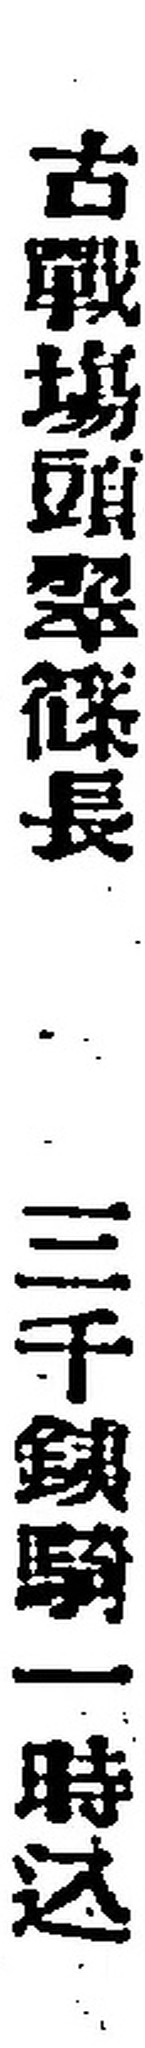古戦場頭翠篠長三千銕騎一時込
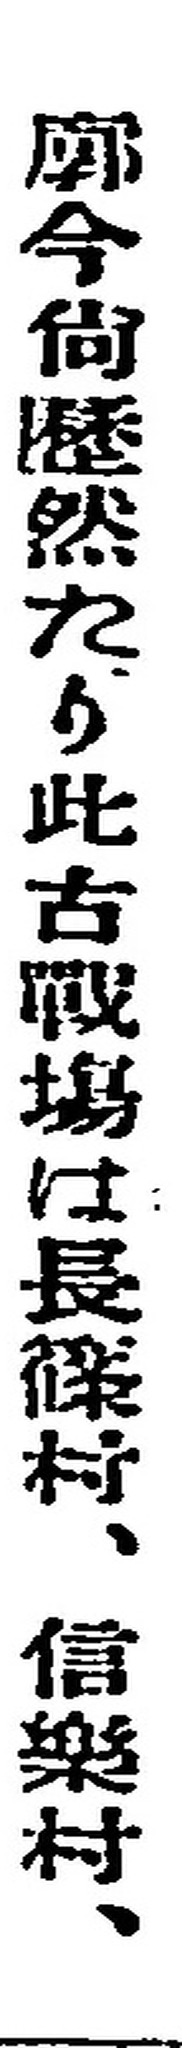廓今尚歴然たり此古戦場は長篠村、信楽村、
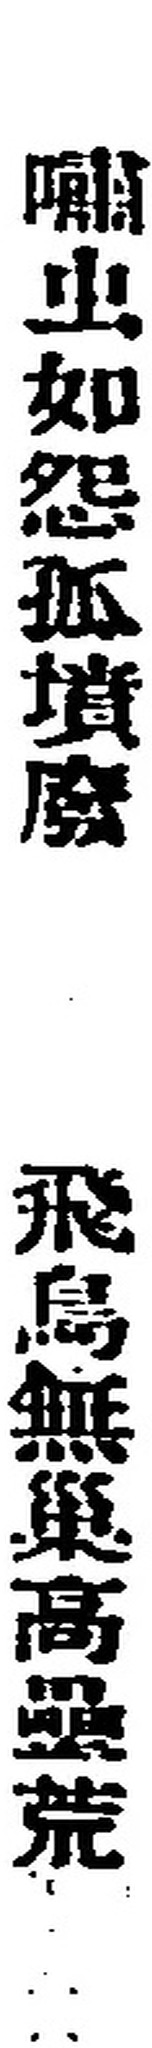嘯虫如怨孤墳廃飛鳥無巣高塁荒
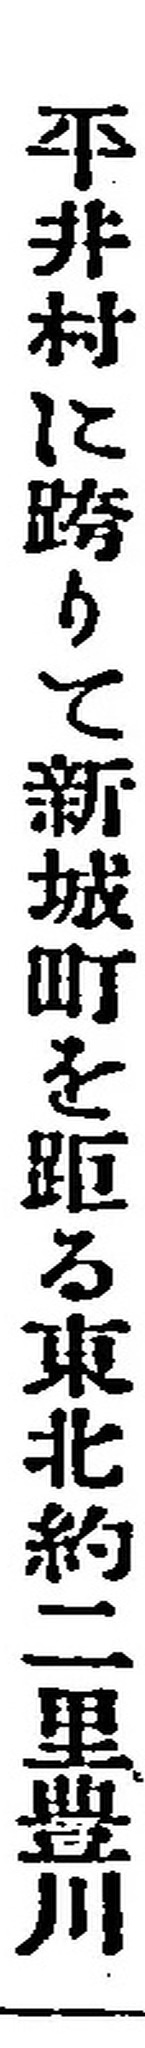平井村に跨りて新城町を距る東北約二里豊川
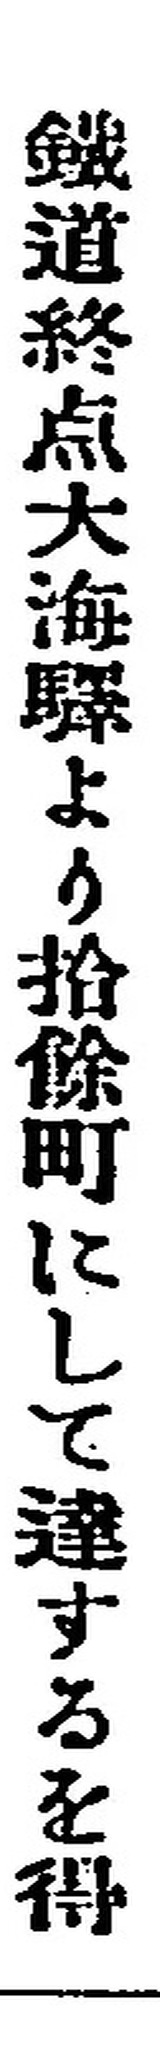鉄道終点大海駅より拾余町にして達するを得
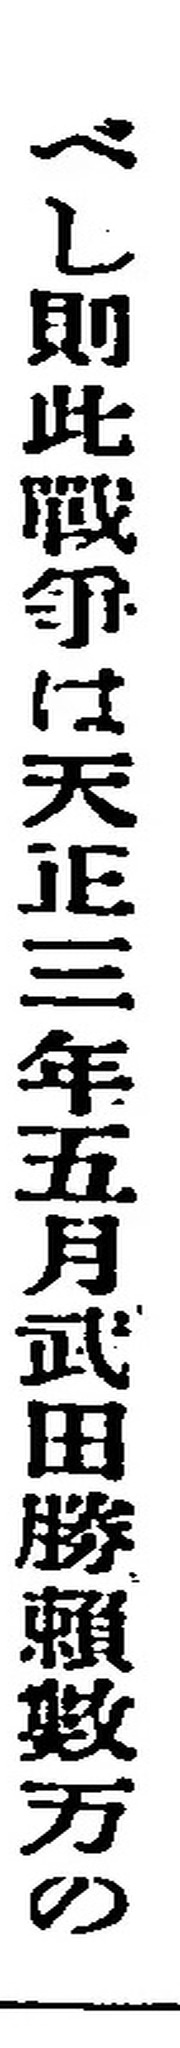べし則此戦争は天正三年五月武田勝頼数万の
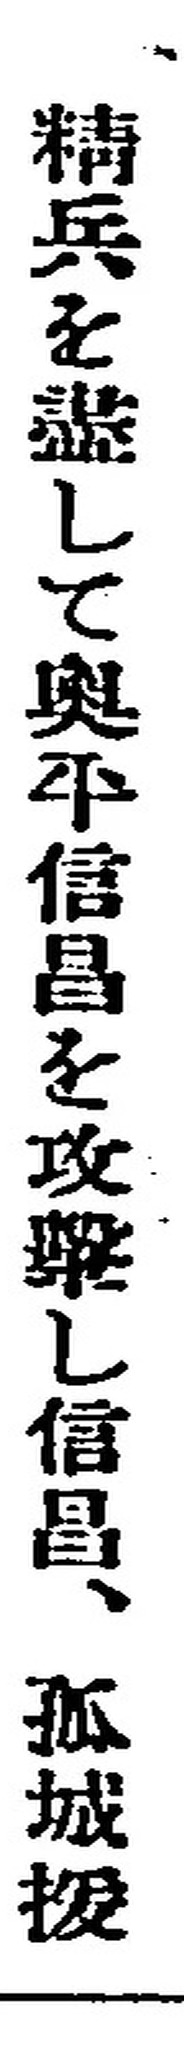精兵を尽して奥平信昌を攻撃し信昌、孤城援
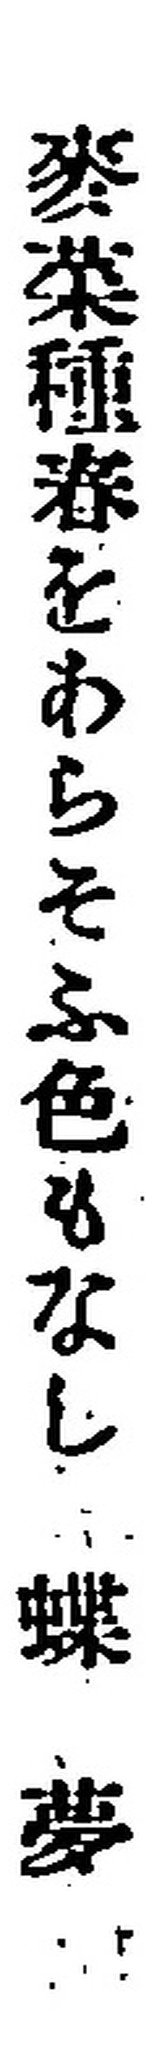麦菜種春をあらそふ色もなし蝶夢
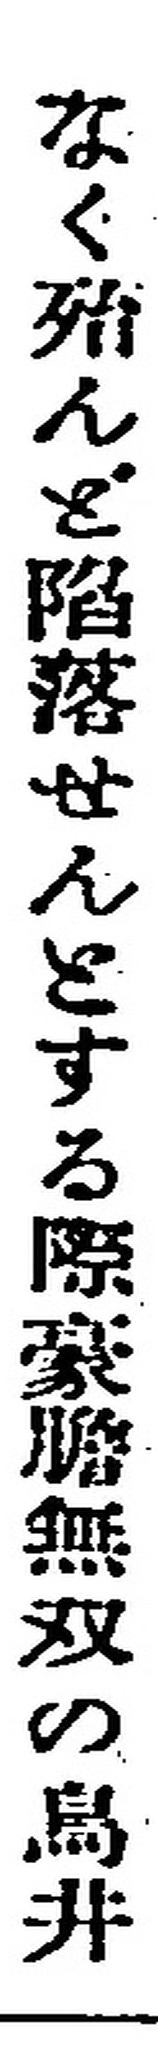なく殆んど陥落せんとする際豪胆無双の鳥井
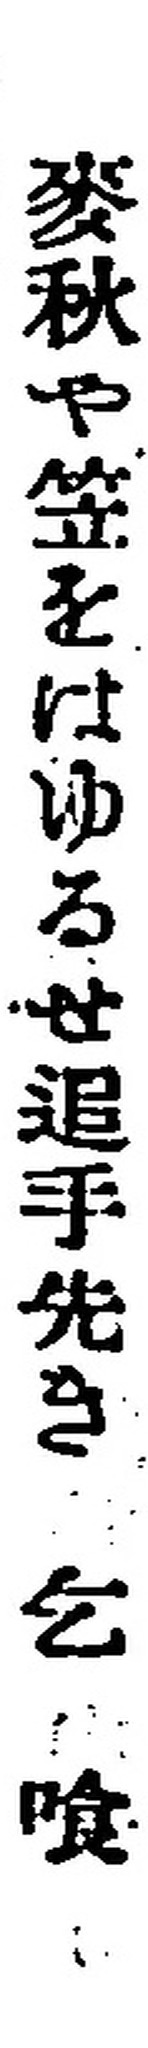麦秋や笠をはゆるせ追手先き乞喰
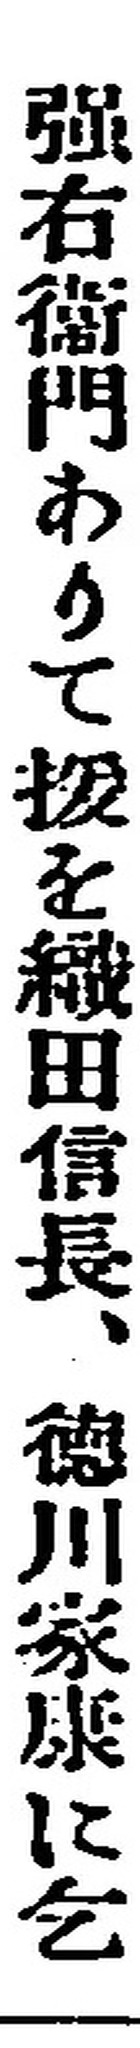強右衛門ありて援を織田信長、徳川家康に乞
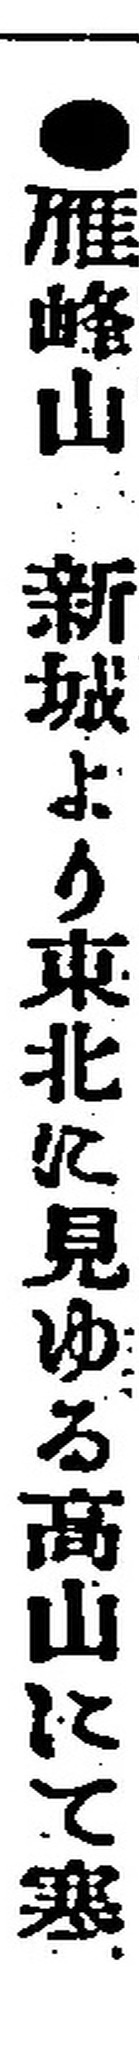●雁峰山新城より東北に見ゆる高山にて寒
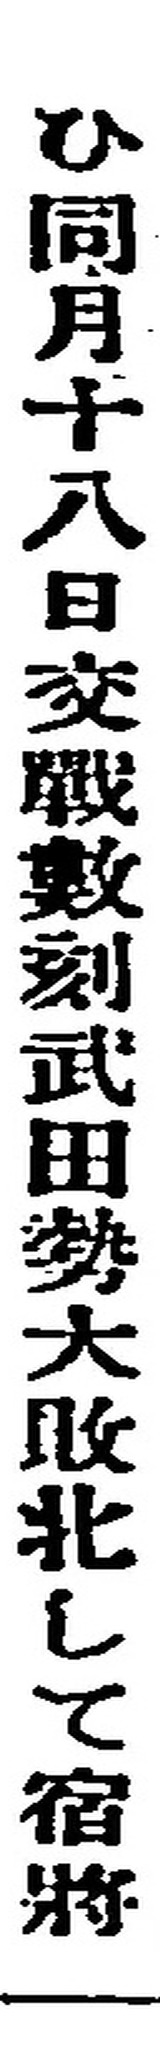ひ同月十八日交戦数刻武田勢大敗北して宿将
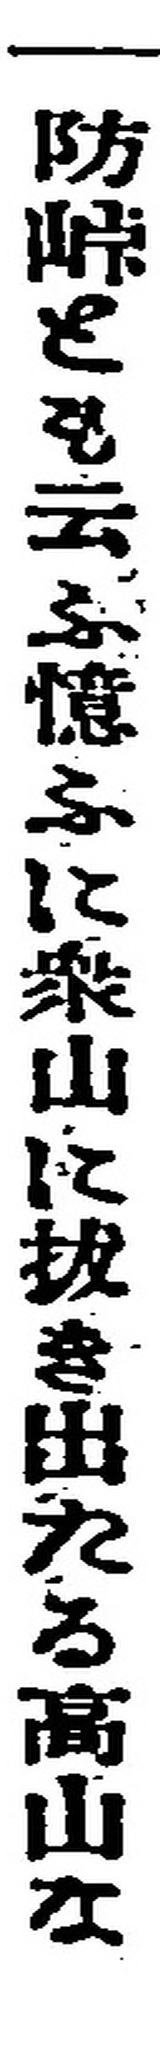防峠とも云ふ憶ふに衆山に抜き出たる高山な
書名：東参名勝案内
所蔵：国立国会図書館 National Diet Library, JAPAN
